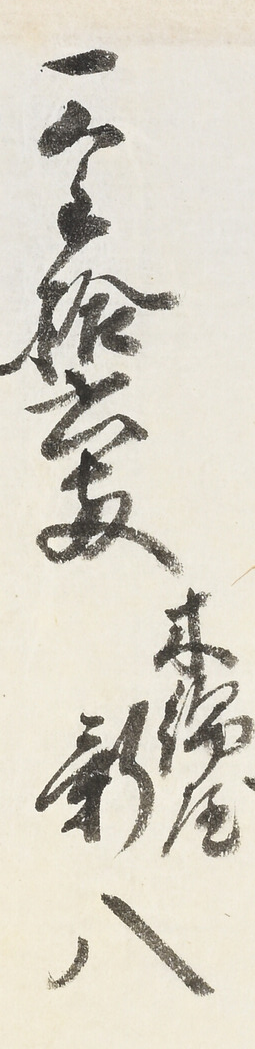一金拾六両新八
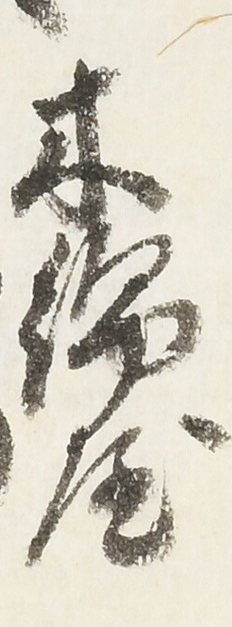木綿屋
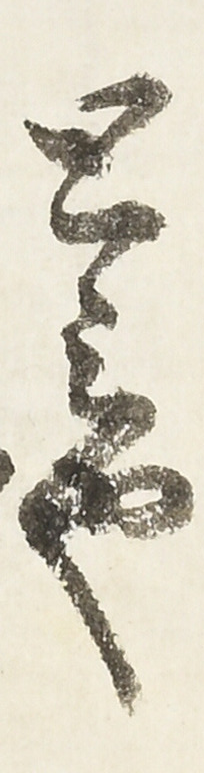とミや
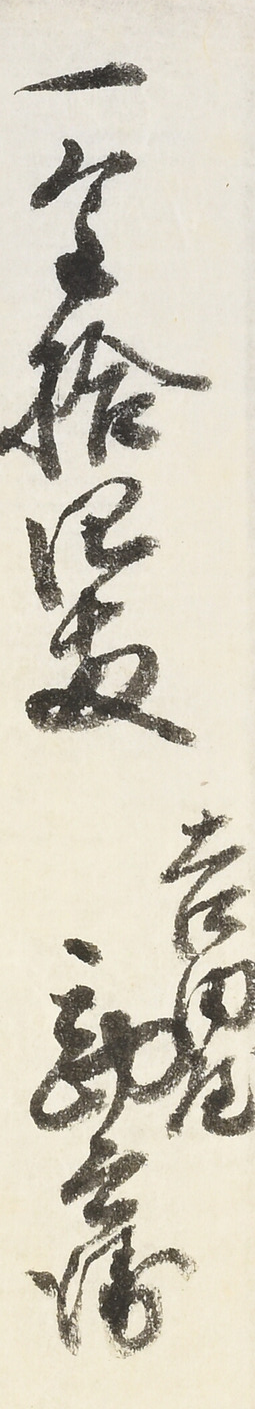一金拾四両勘兵衛
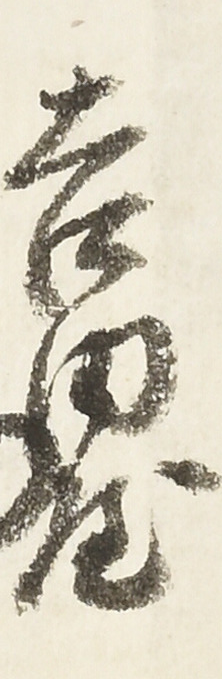吉田屋
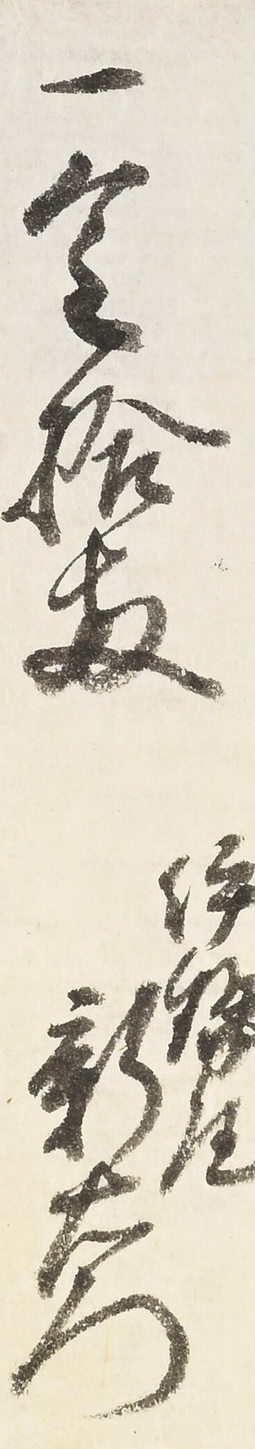一金拾両新右衛門
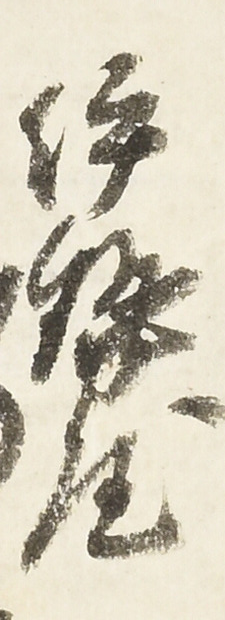伊勢屋
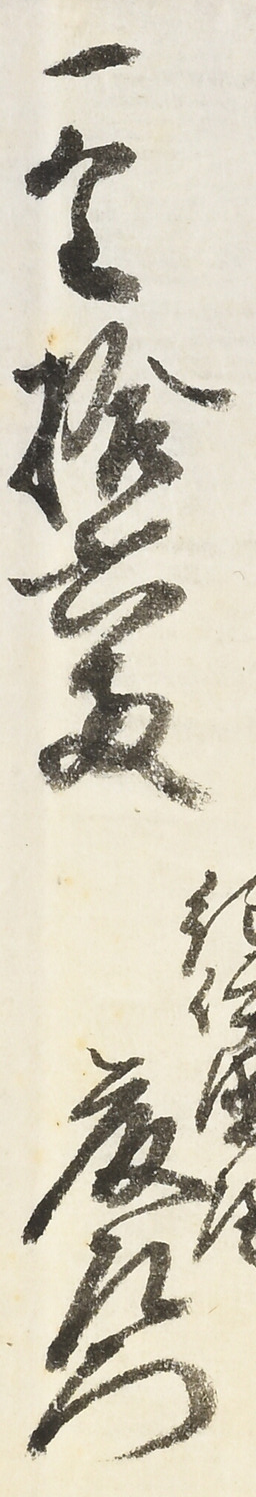一金拾六両藤左衛門
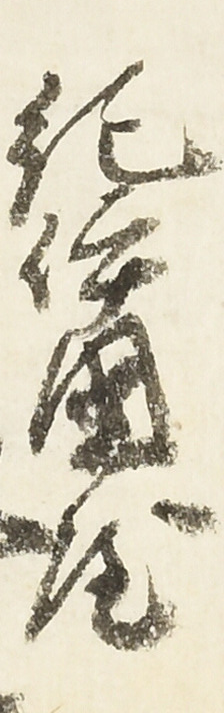紀伊国屋
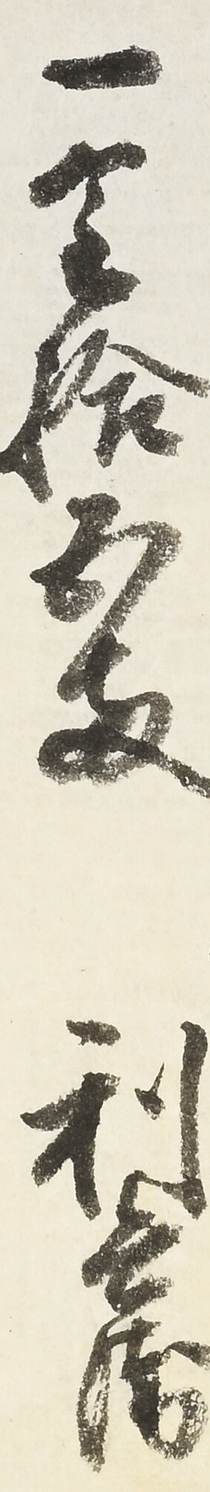一金拾五両利兵衛
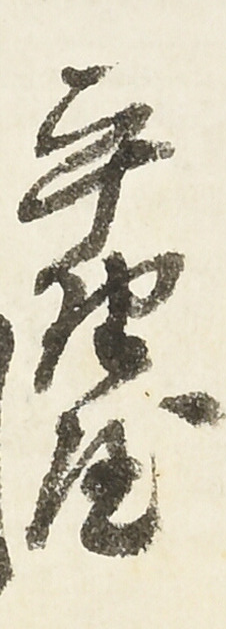平野屋
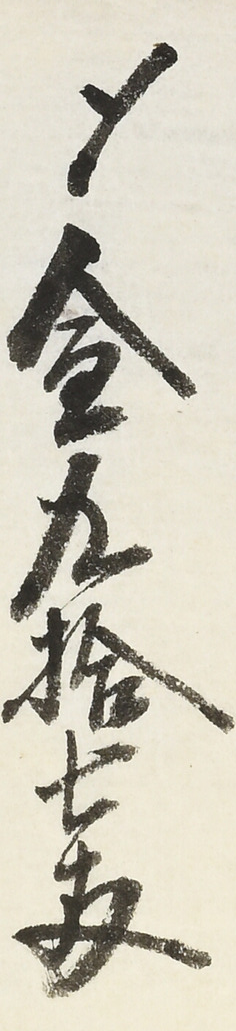〆金九拾七両

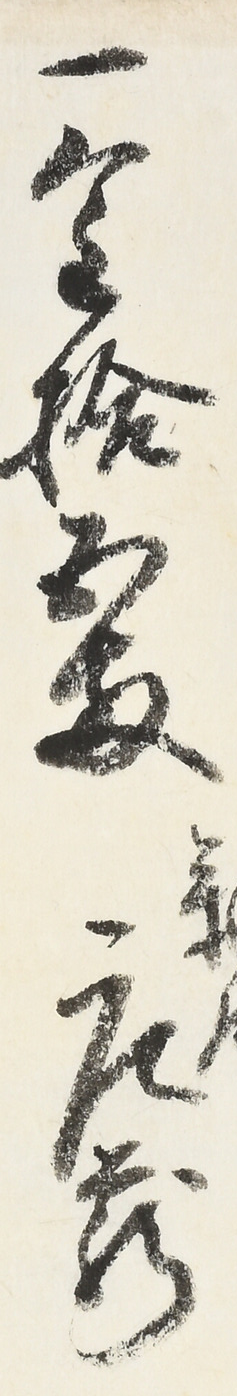一金拾五両庄蔵
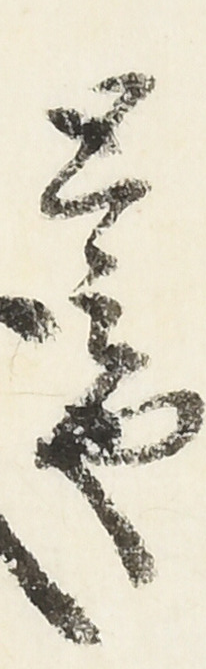とミや
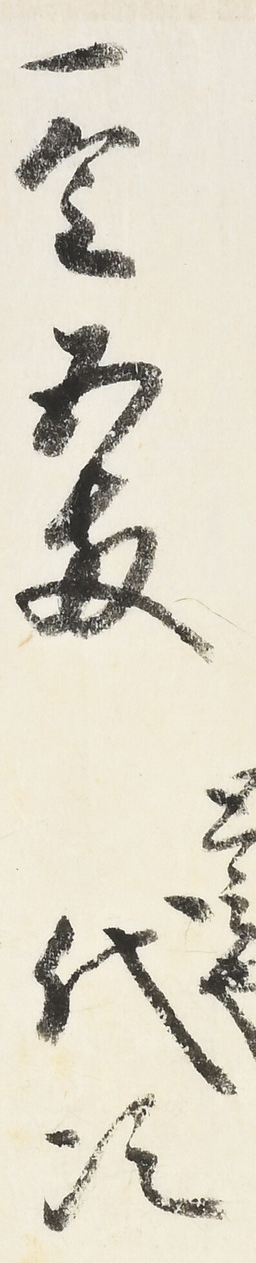一金五両代次
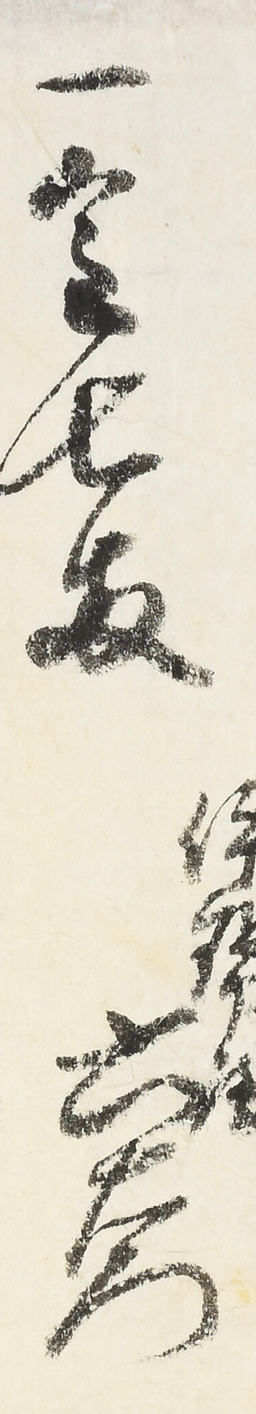一金七両六右衛門
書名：御乗出シ御才覚金割合扣帳
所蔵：伊那市立高遠町図書館・合同会社AMANE
